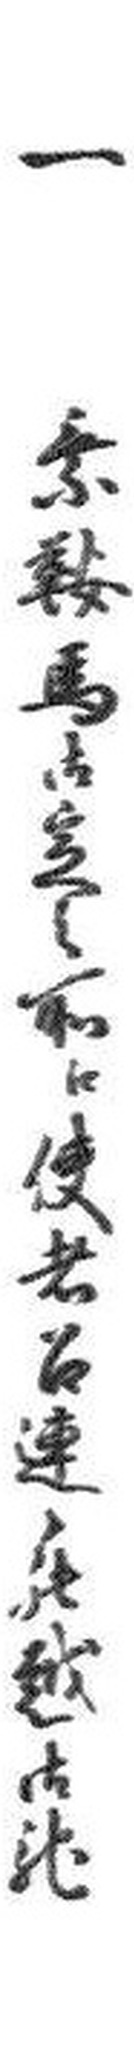一乗鞍馬御定之所江使者召連罷越御馳

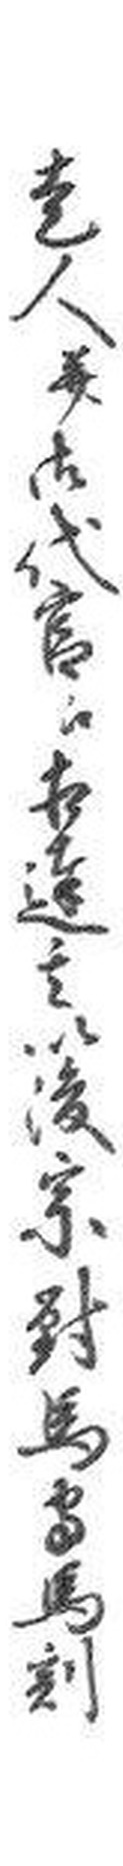壱人并御代官江相達其以後宗対馬守馬割
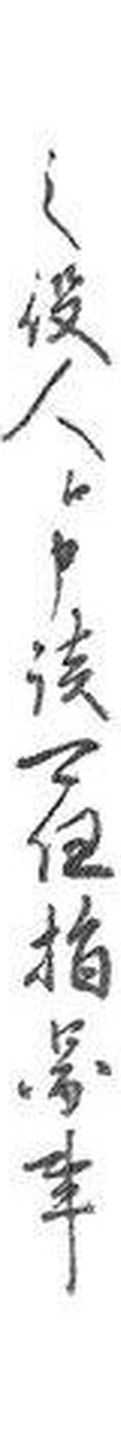之役人江申談可任指図事
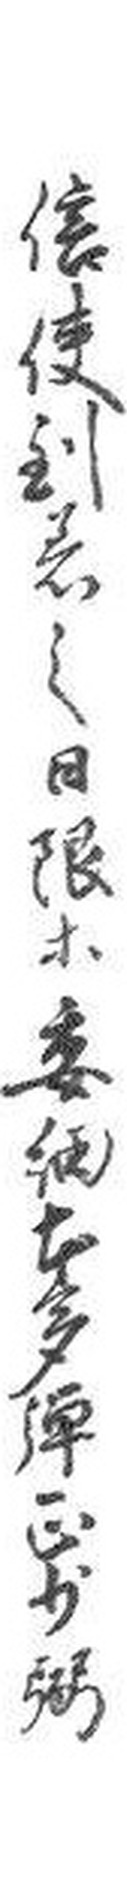一信使到着之日限等委細本多弾正少弼
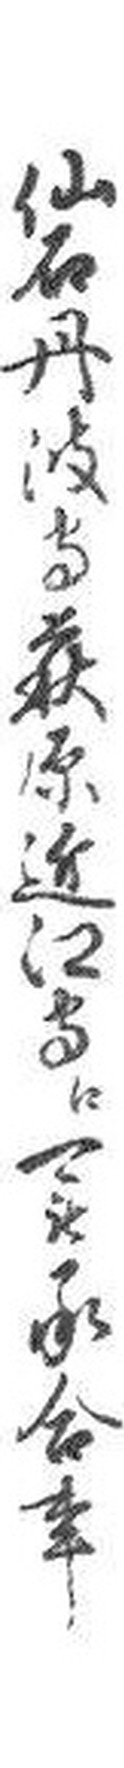仙石丹波萩原近江守江可被承合事
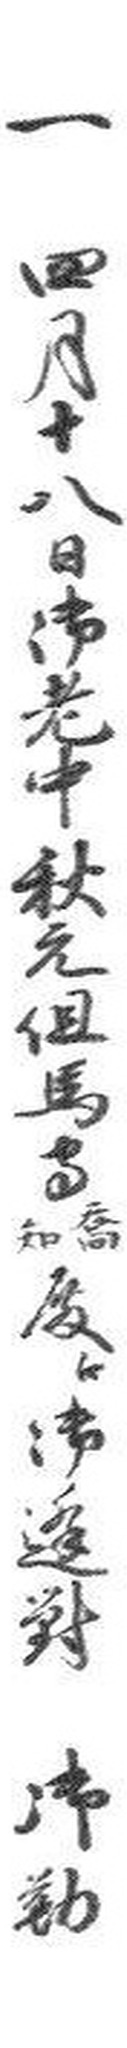一四月十八日御老中秋元但馬守喬知殿江御逢對御勤
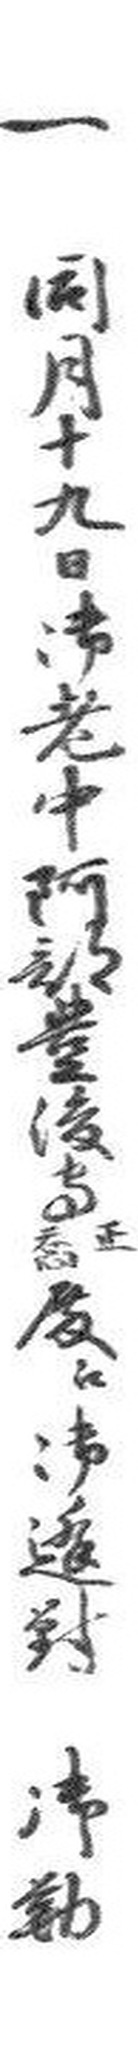一同月十九日御老中阿部豊後守正喬殿江御逢對御勤
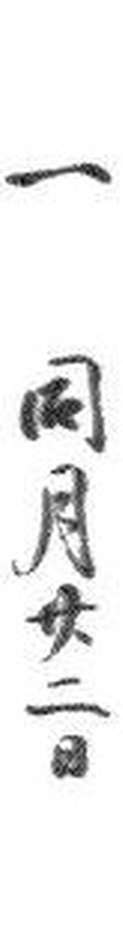一同月廿二日
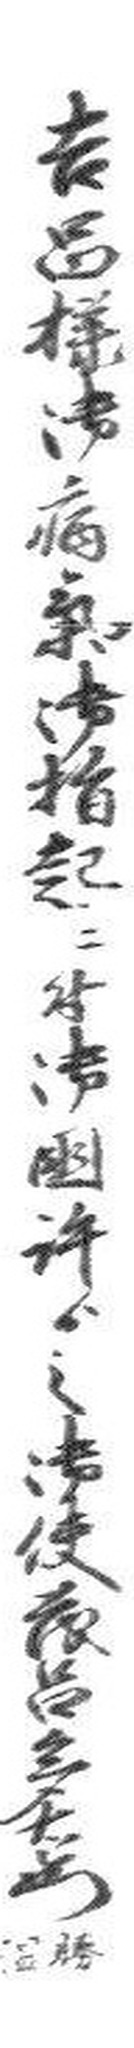吉品様御病気御指起ニ付御国許ゟ之御使茂呂多右衛門勝
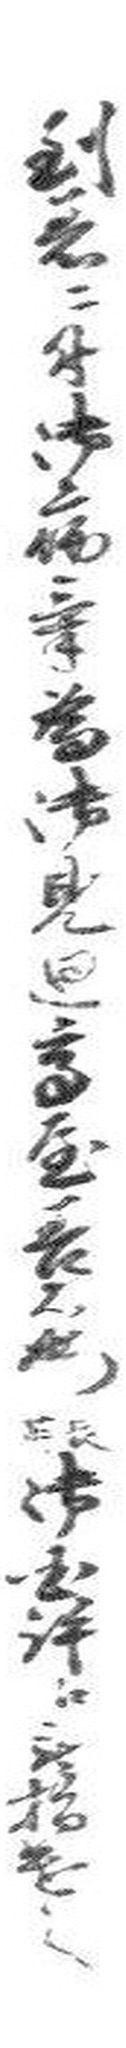到着ニ付御病気為御見廻高屋善右衛門長英御国許江被指遣之
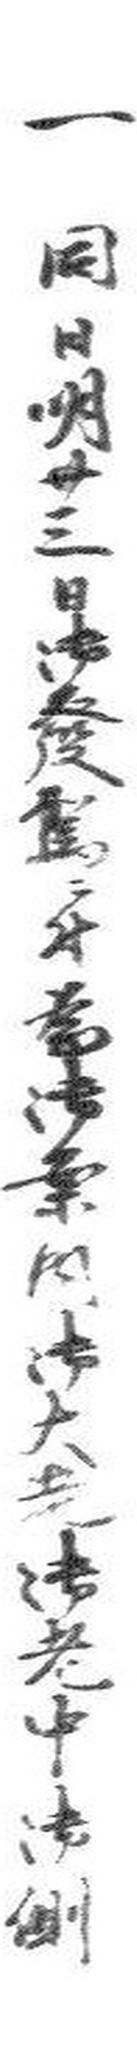一同日明廿三日御発駕ニ付為御案内御大老御老中御側
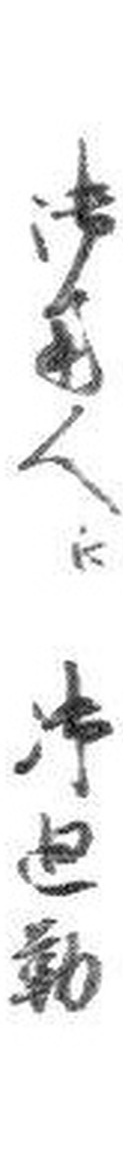御用人江御廻勤
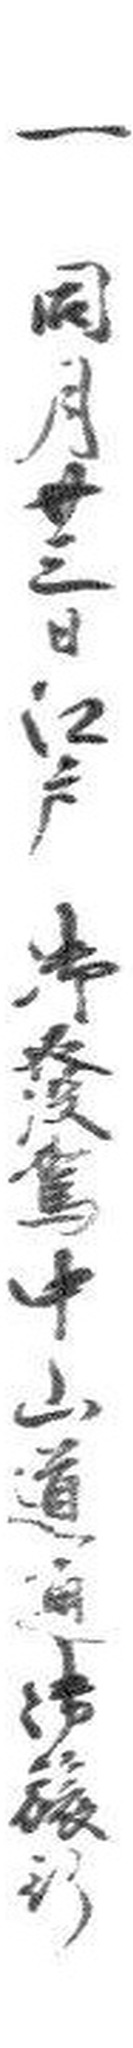一同月廿三日江戸御発駕中山道通御旅行
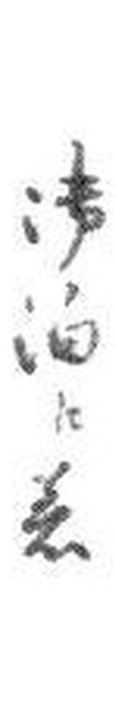御泊江着
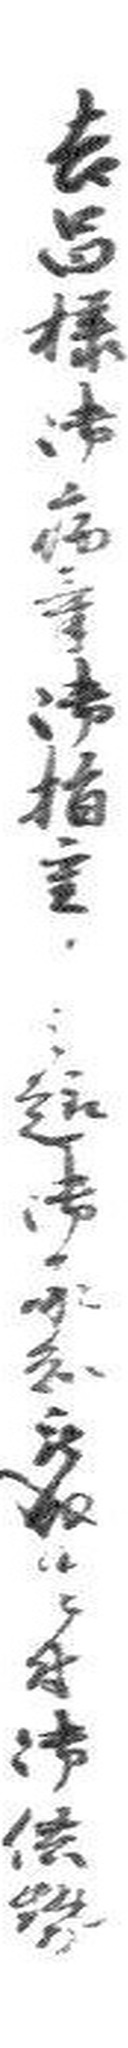吉品様御病気御指重之趣御承知被成候ニ付御供勢
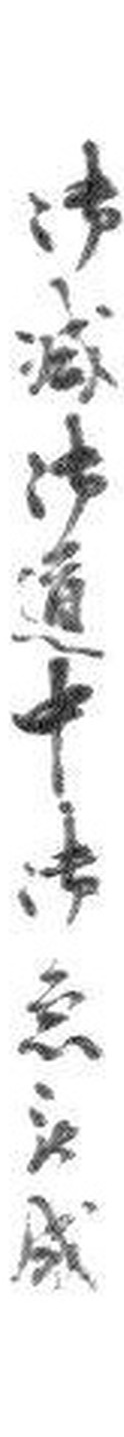御減御道中御急被成
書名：家譜 二十八 吉邦公 従宝永七年七月五日到正徳元年十二月
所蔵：福井県文書館 Fukui Prefectural Archives
